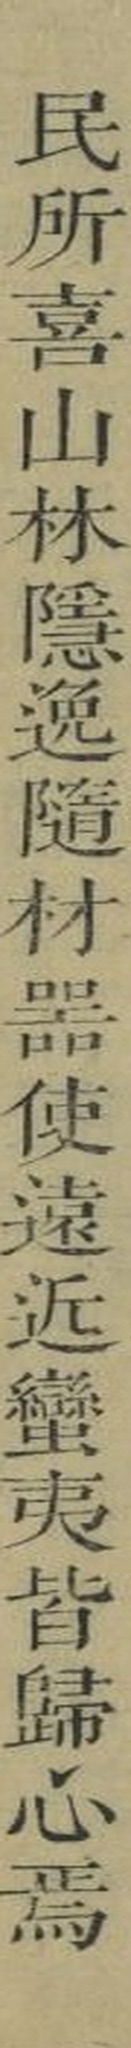民所喜山林隠逸随材器使遠近蛮夷皆帰心焉
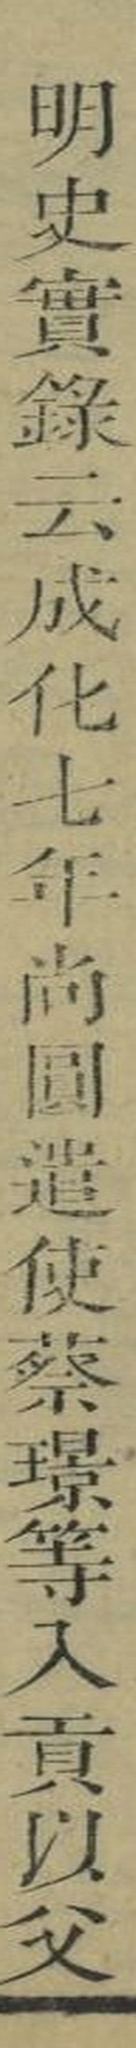明史実録云成化七年尚円遣使蔡璟等入貢以父
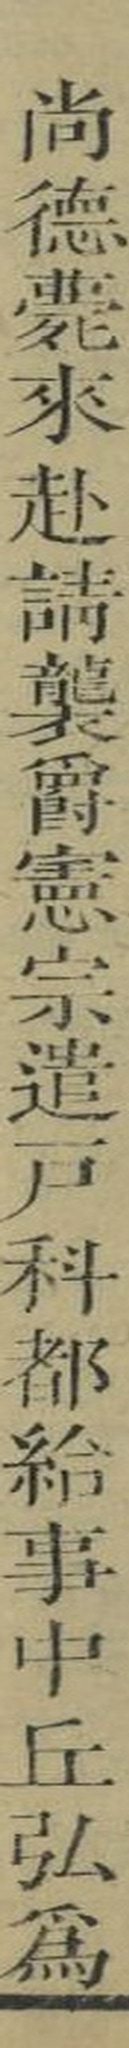尚徳薨来赴請襲爵憲宗遣戸科都給事中丘弘為
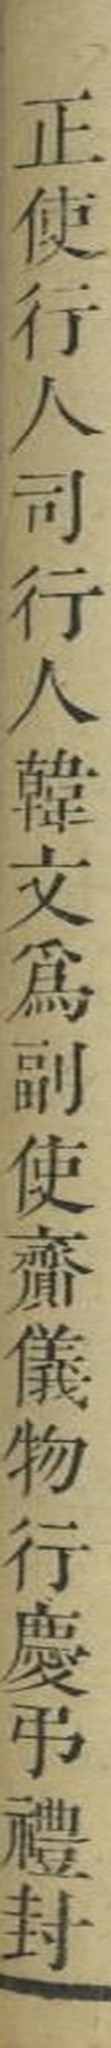正使行人司行人韓文為副使齎儀物行慶弔礼封
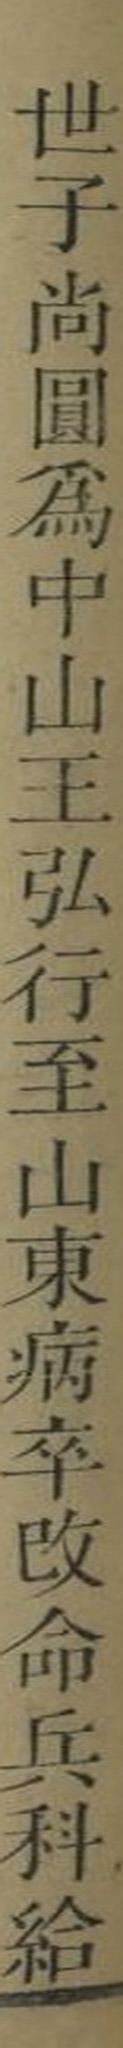世子尚円為中山王弘行至山東病卒改命兵科給
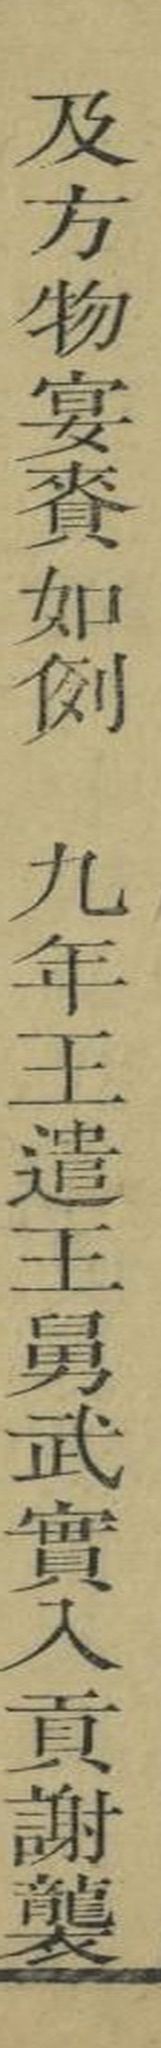及方物宴賚如例九年王遣王舅武実入貢謝襲
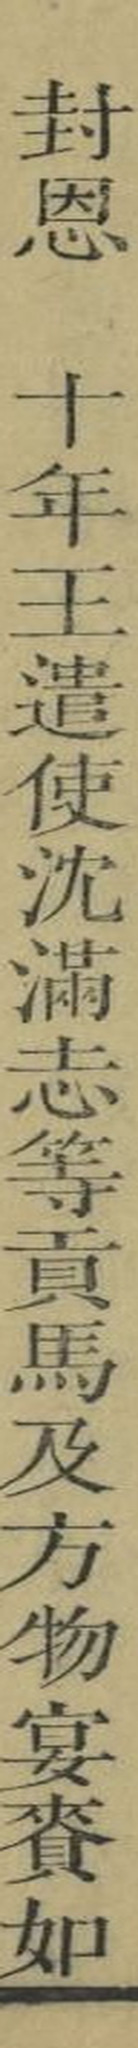封恩十年王遣使沈満志等貢馬及方物宴賚如
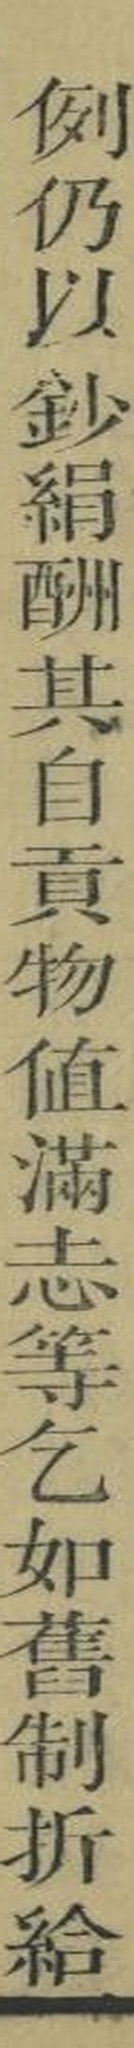例仍以鈔絹酬其自貢物値満志等乞如旧制折給
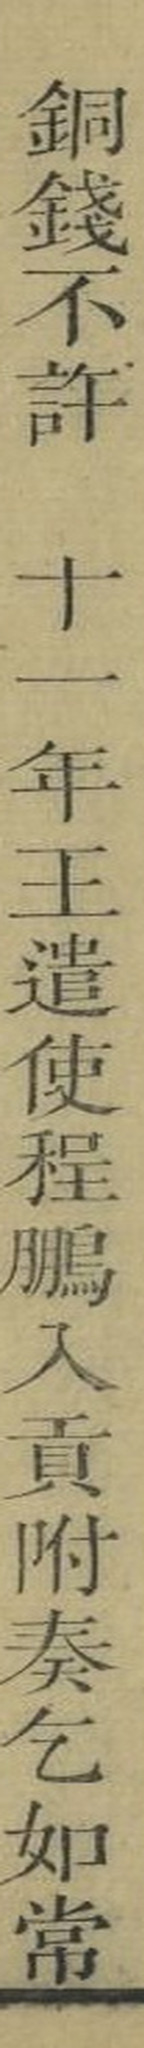銅銭不許十一年王遣使程鵬入貢附奏乞如常
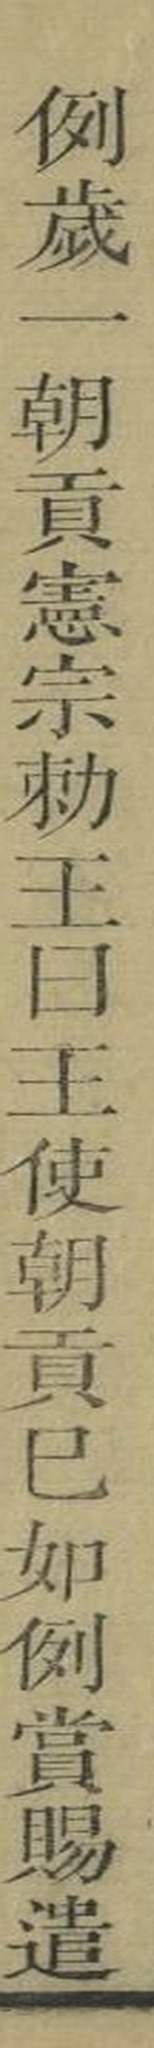例歳一朝貢憲宗勅王曰王使朝貢巳如例賞賜遣
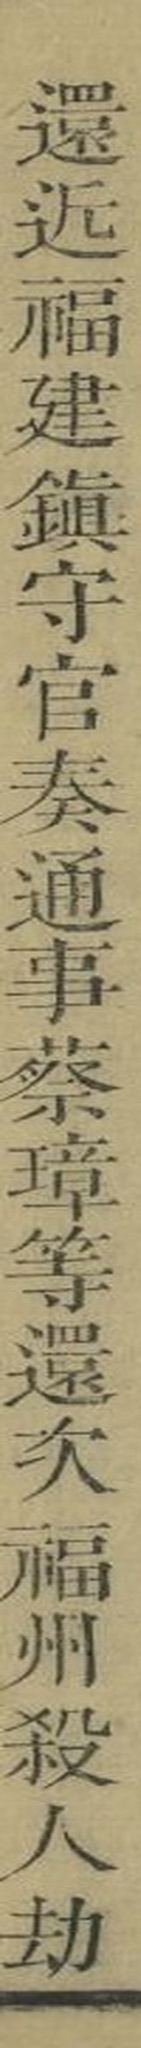還近福建鎮守官奏通事蔡璋等還次福州殺人劫
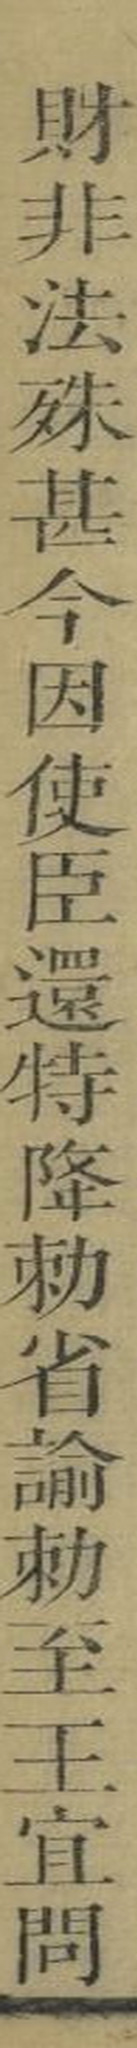財非法殊甚今因使臣還特降勅省諭勅至王宜問

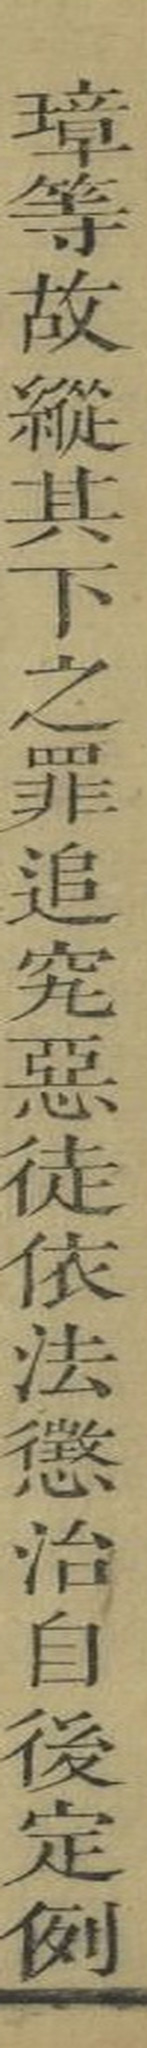璋等故縦其下之罪追究悪徒依法懲治自後定例
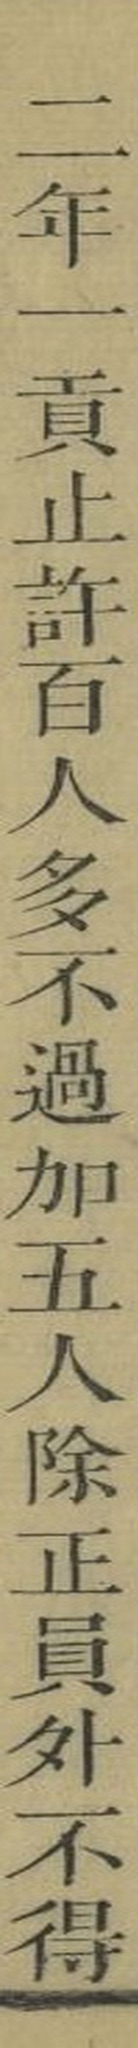二年一貢止許百人多不過加五人除正員外不得
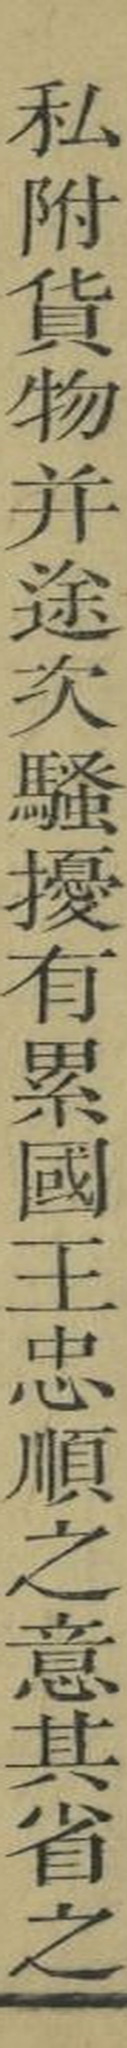私附貨物并途次騒擾有累国王忠順之意其省之
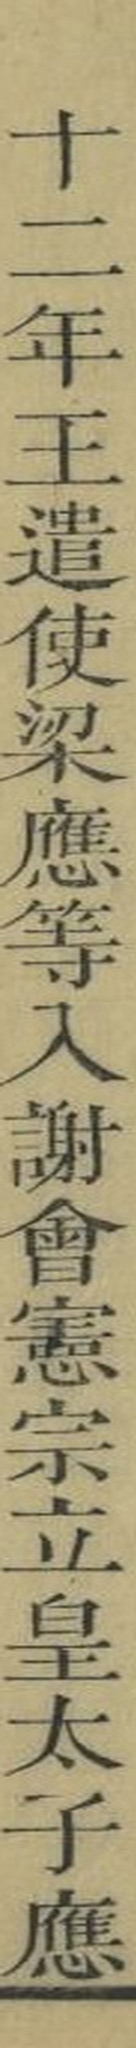十二年王遣使梁応等入謝会憲宗立皇太子応
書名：中山伝信録 巻三
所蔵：University of the Ryukyus Library
